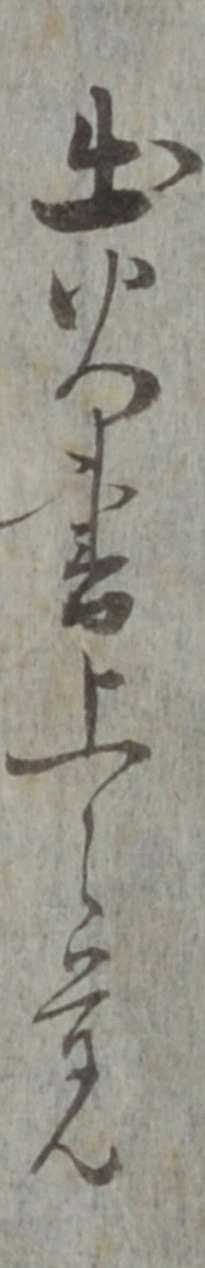出火書上之覚
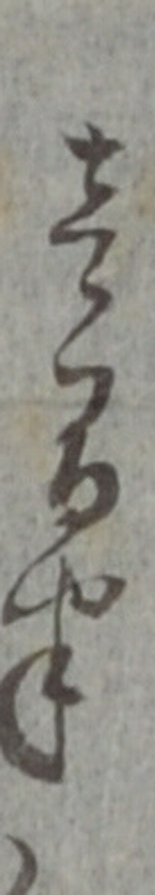壱間半
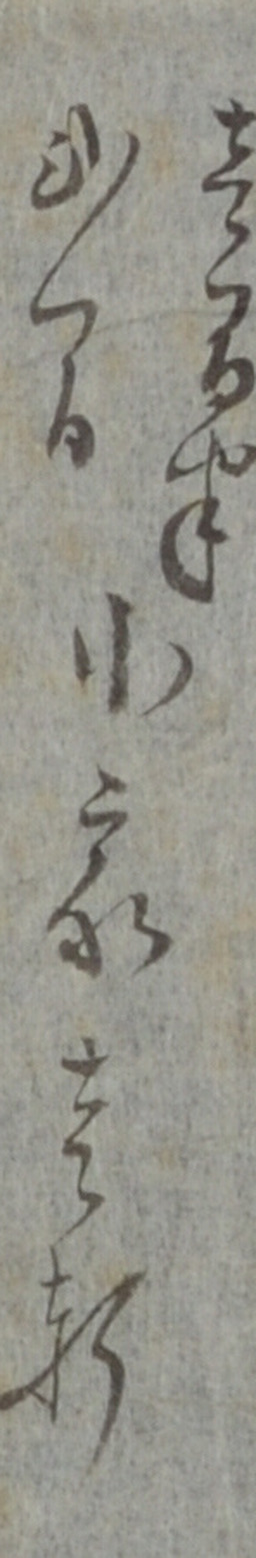弐間小家壱軒
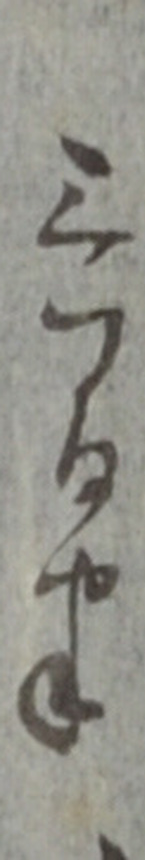壱間半
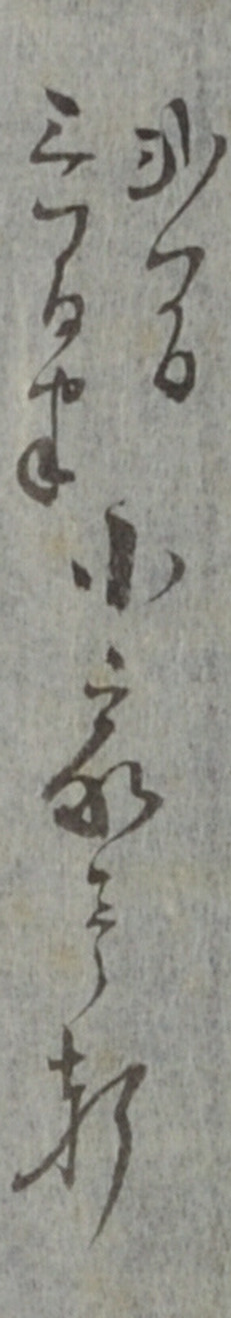三間半小家壱軒
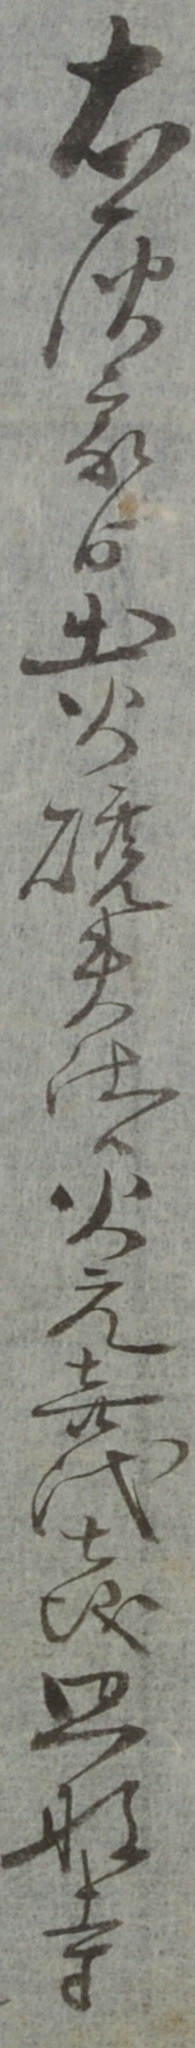右灰家ゟ出火焼失仕候火元喜代儀旦那寺
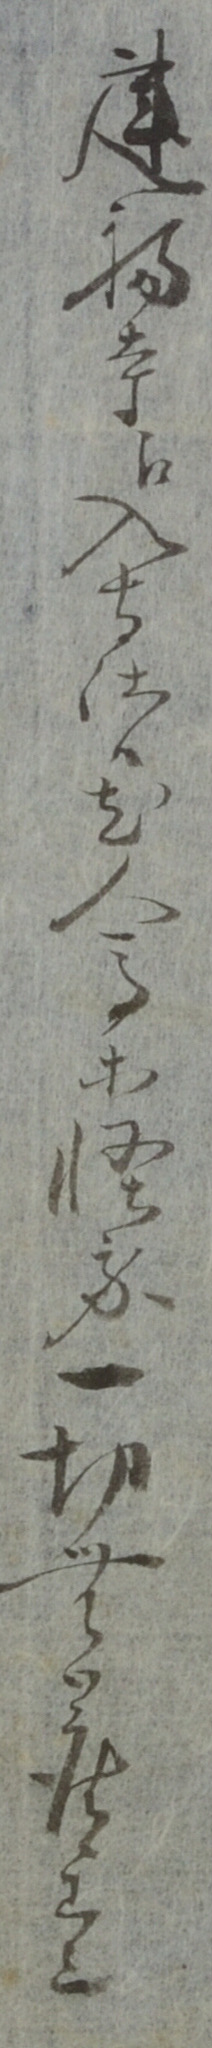建福寺江入寺仕候尤人馬等怪家一切村御座候已上
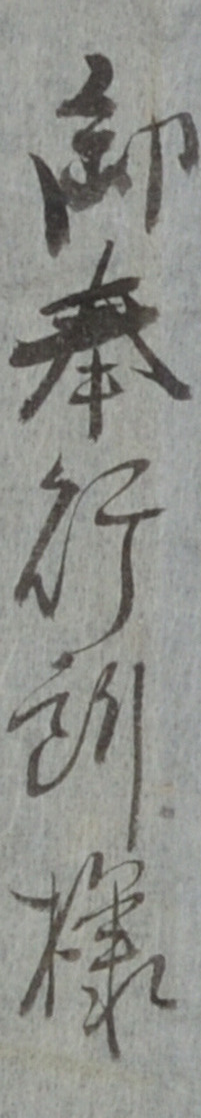御奉行所様
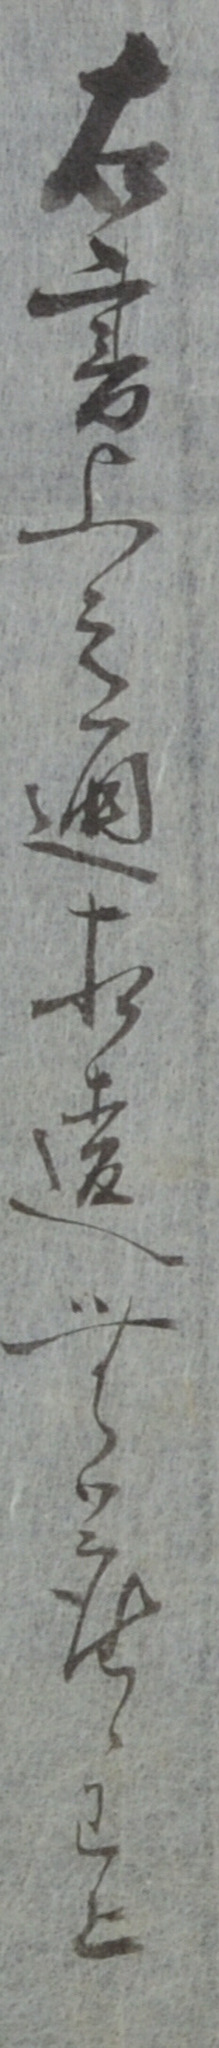右書上之通相違無御座候已上
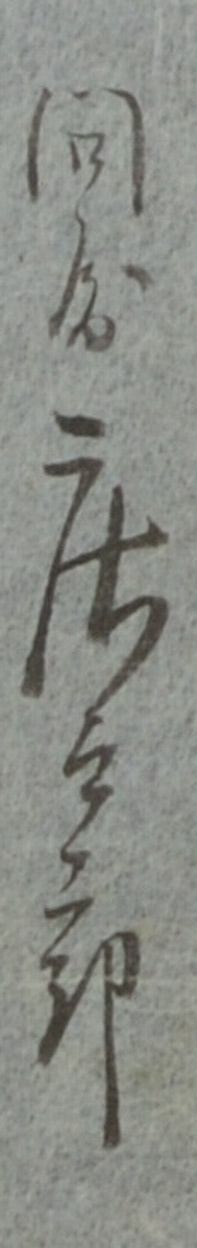問屋庄太郎
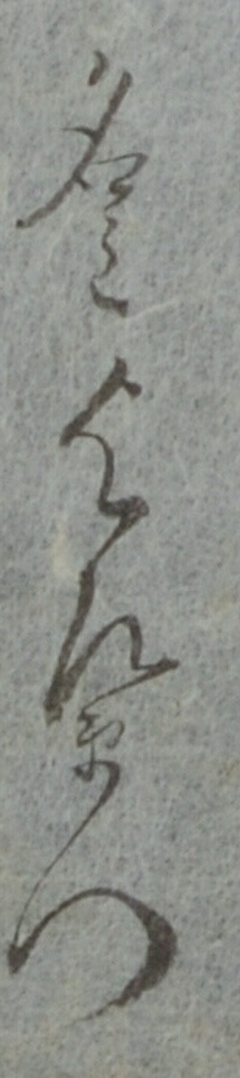名主与左衛門
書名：出火書上之覚
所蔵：伊那市立高遠町図書館・合同会社AMANE
